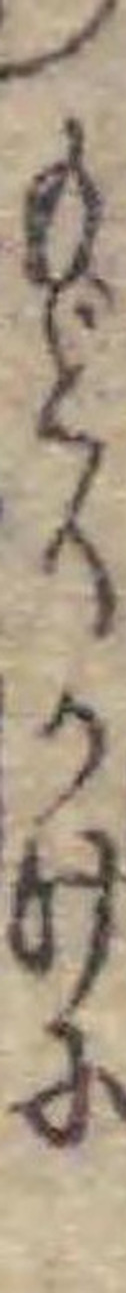もどりかけに
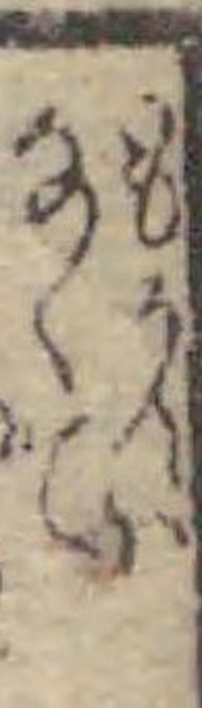なくて
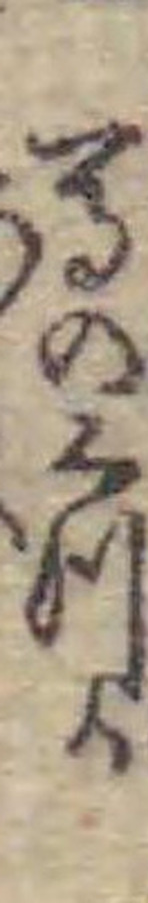馬のくつか
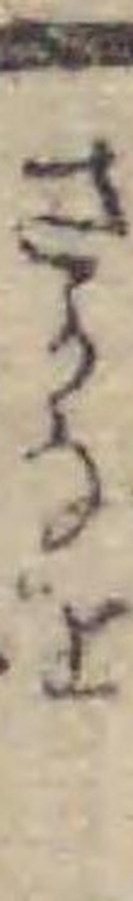さかなを
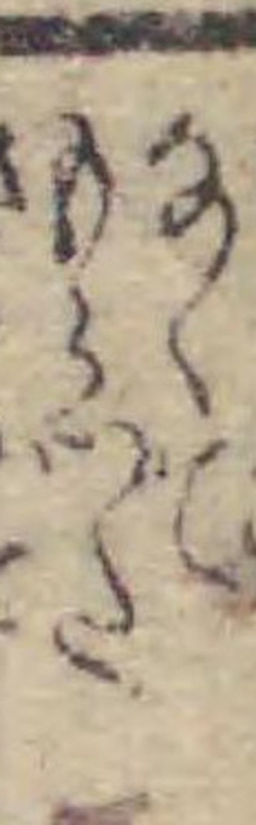もらつた
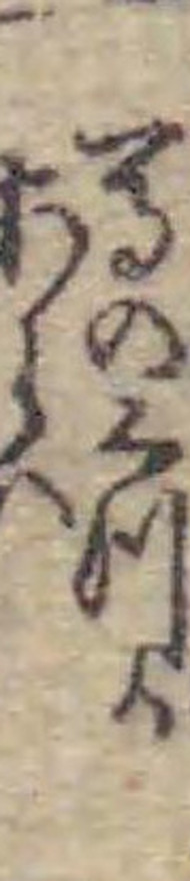あらは
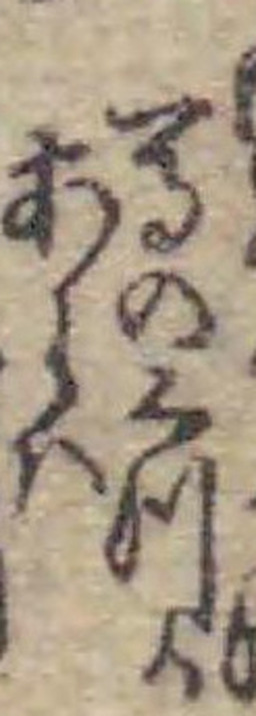あらは
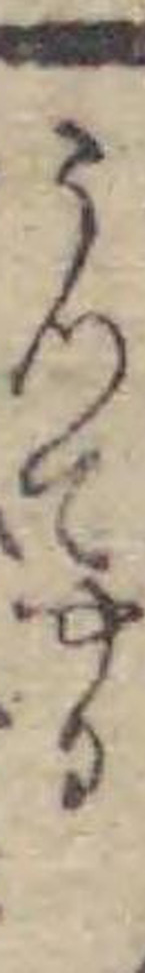うつてやる
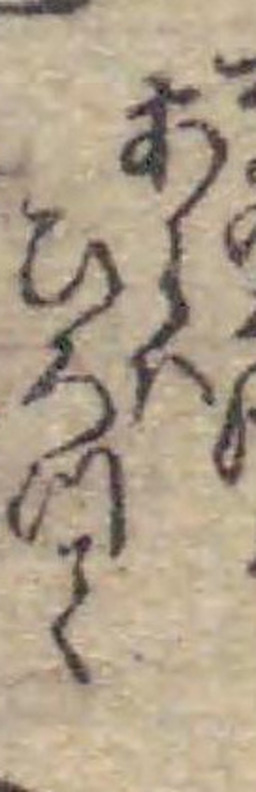ひろつて
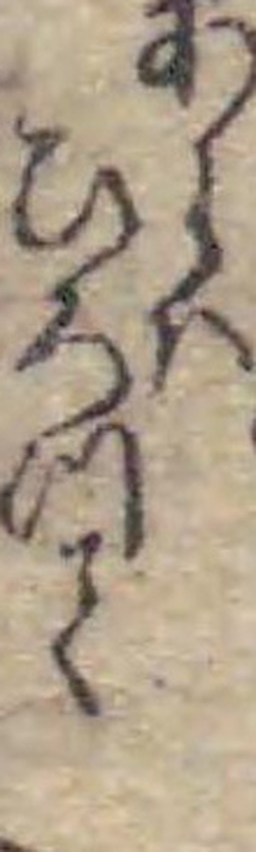ひろつて
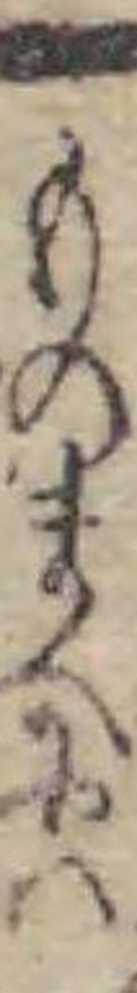ものまへには
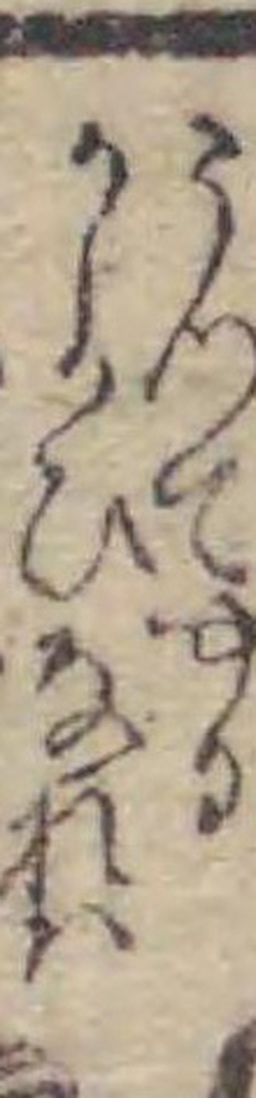かよひなれは
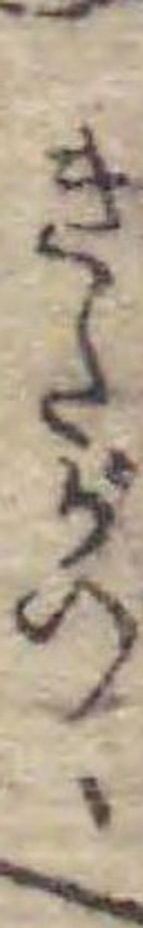きたがいゝ
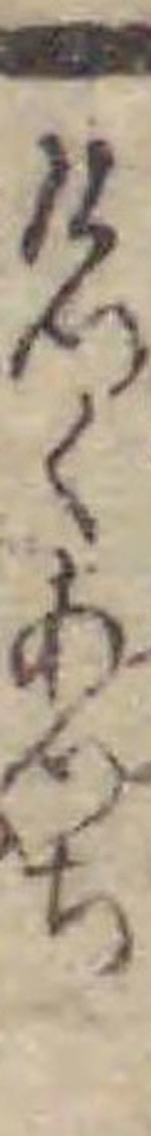けつくあつち
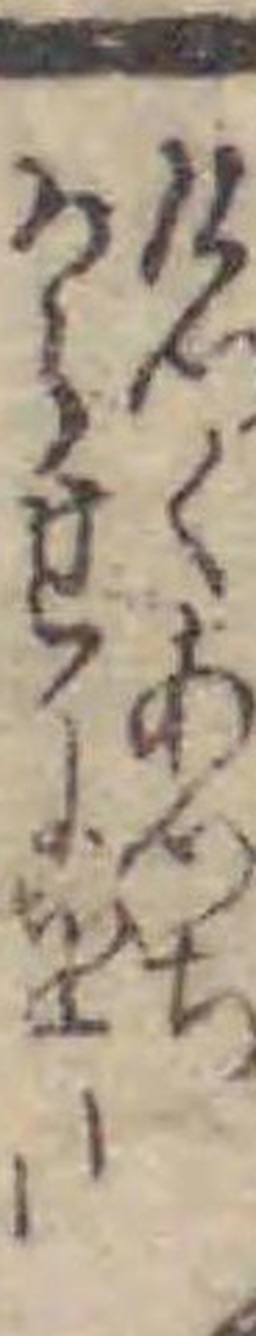からせにを
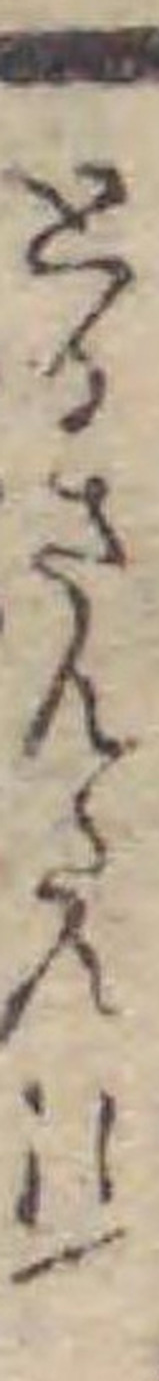とるさんたん
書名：新鋳小判 : 3巻
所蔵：国立国会図書館 National Diet Library, JAPAN
